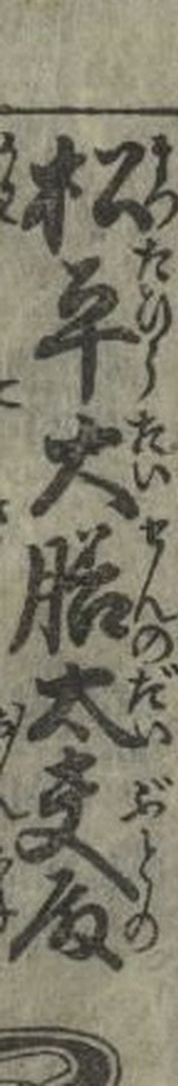松平大膳太夫殿
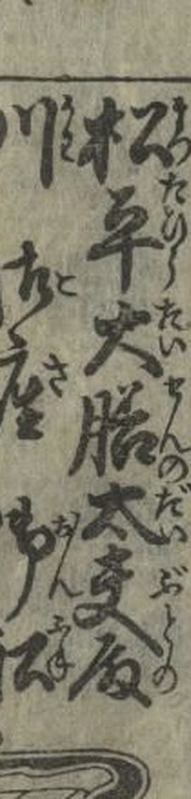松平大膳太夫殿
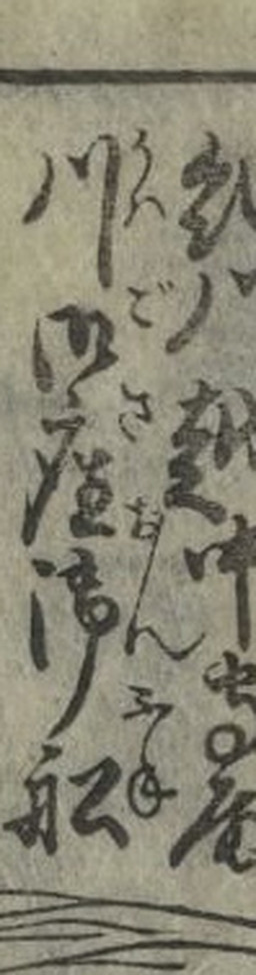川御座御船
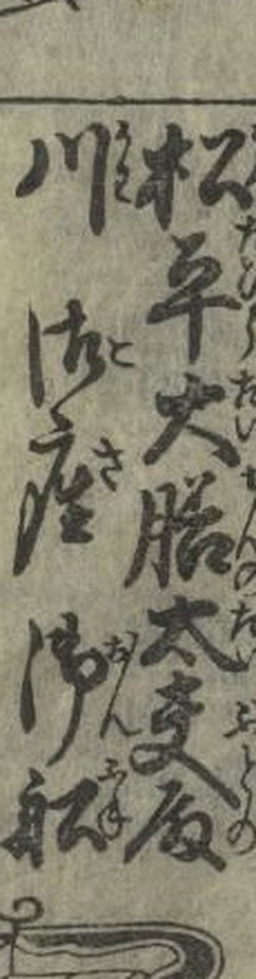川御座御船
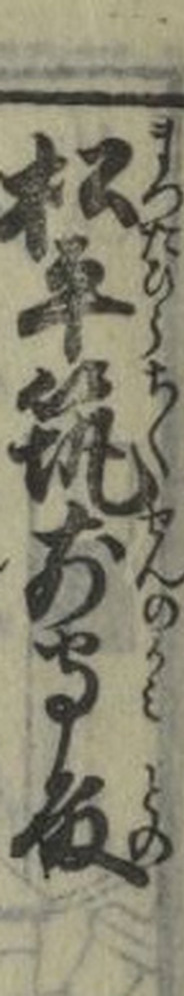松平筑前守殿
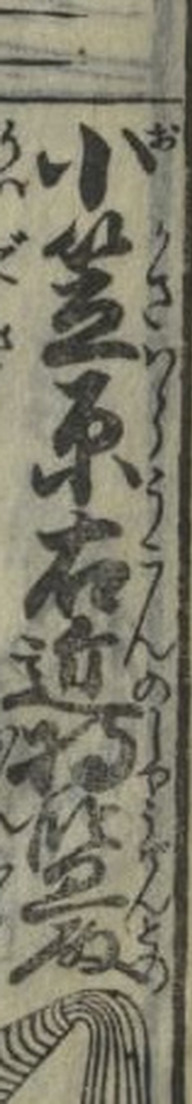小笠原右近将監殿
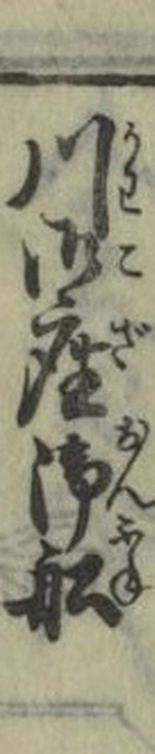川御座御船
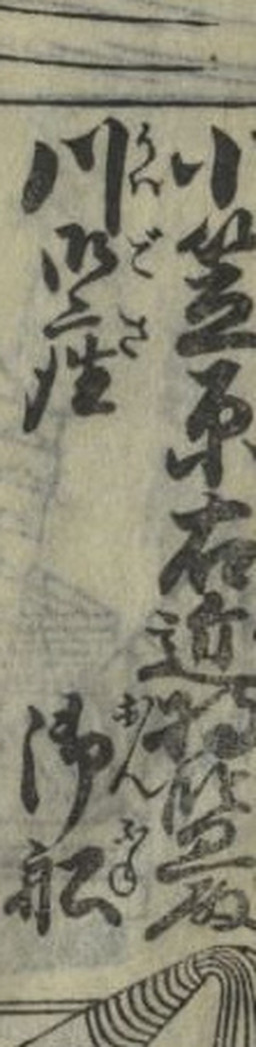川御座御船

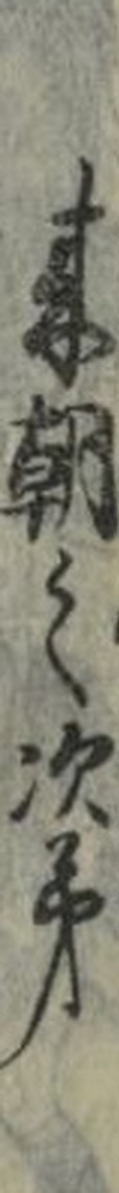来朝之次第
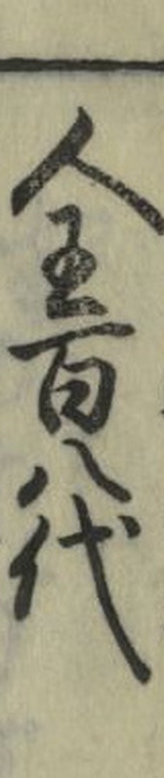人王百八代
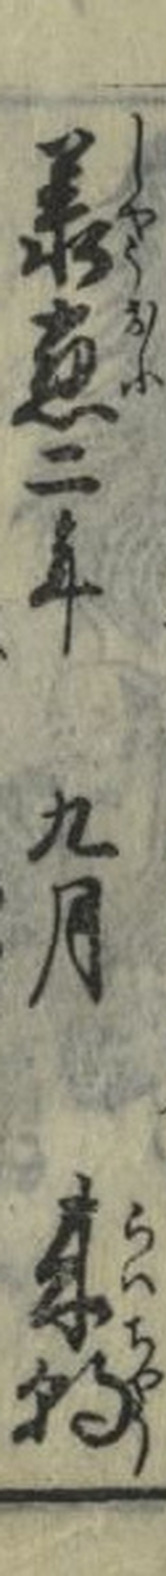承應二年九月来朝
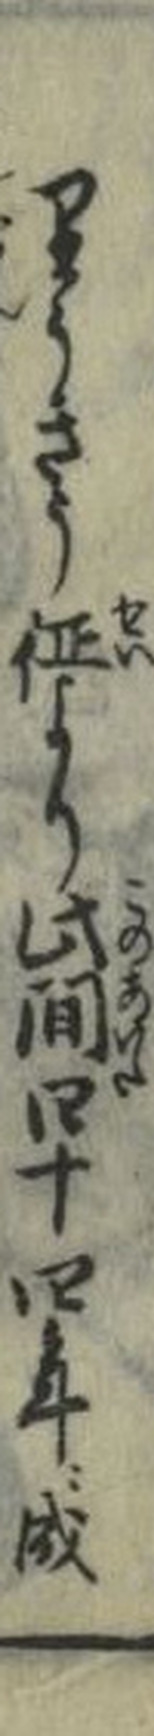りうきう征より此間四十四年に成
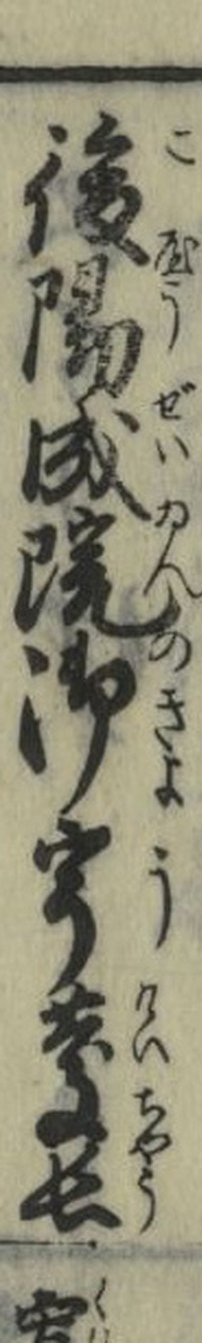後陽成院御宇慶長
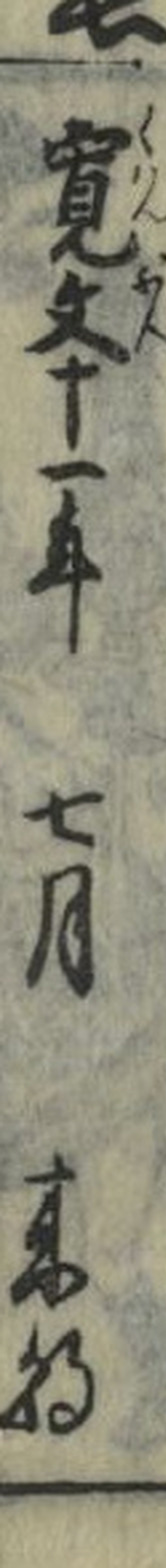寛文十一年七月来朝
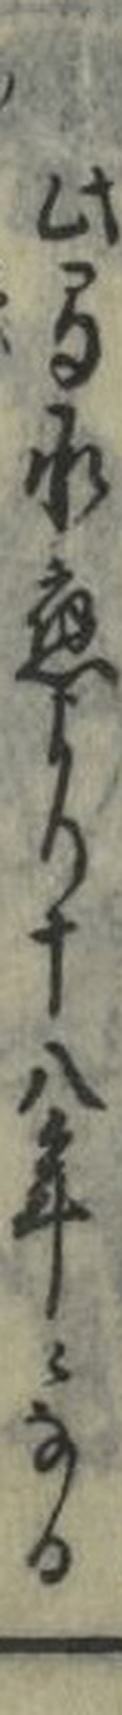此間承應より十八年になる
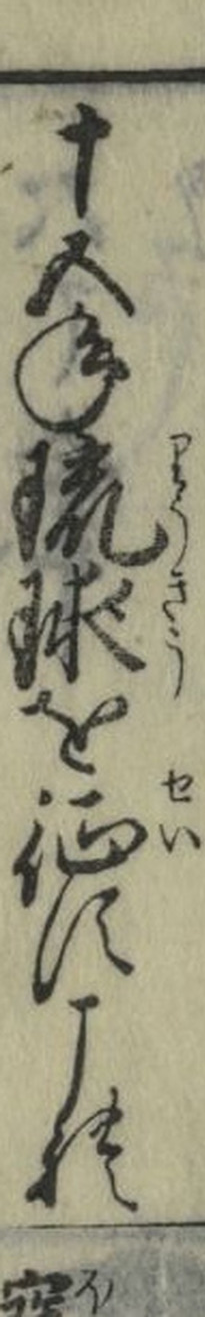十五年琉球を征すこれ
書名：琉球人大行列記
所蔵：University of the Ryukyus Library
